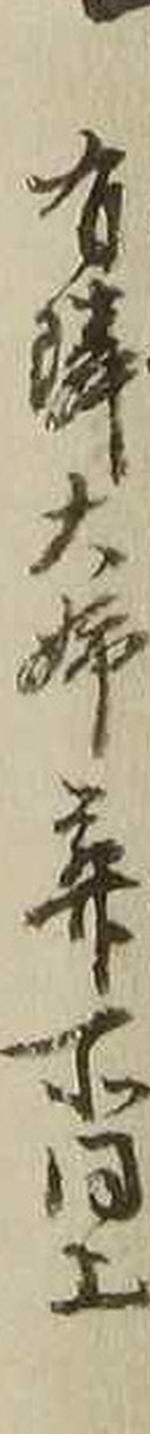有隣大姉葬所同上
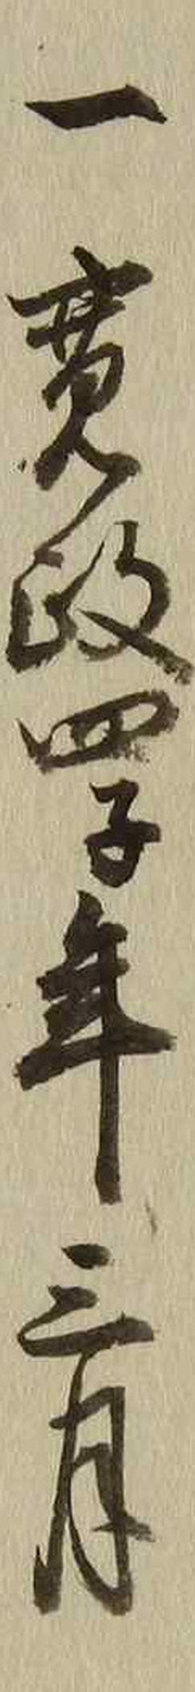一寛政四子年三月
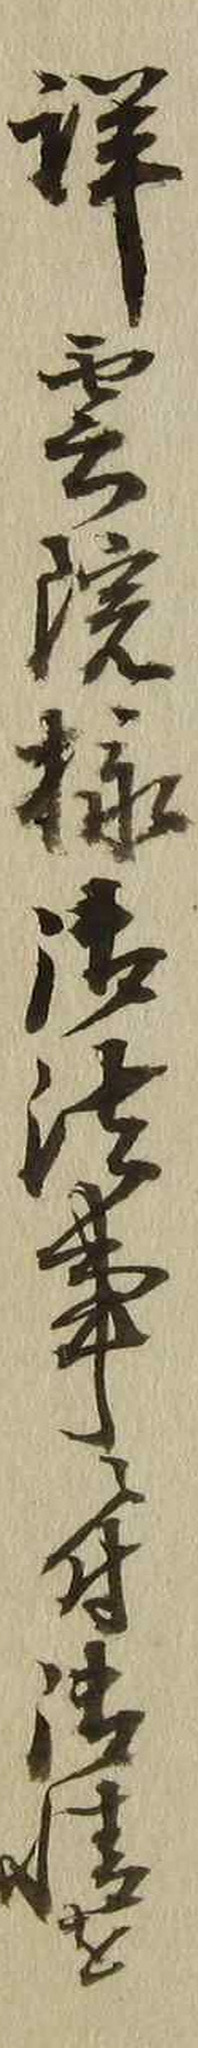祥雲院様御法事ニ付御情を
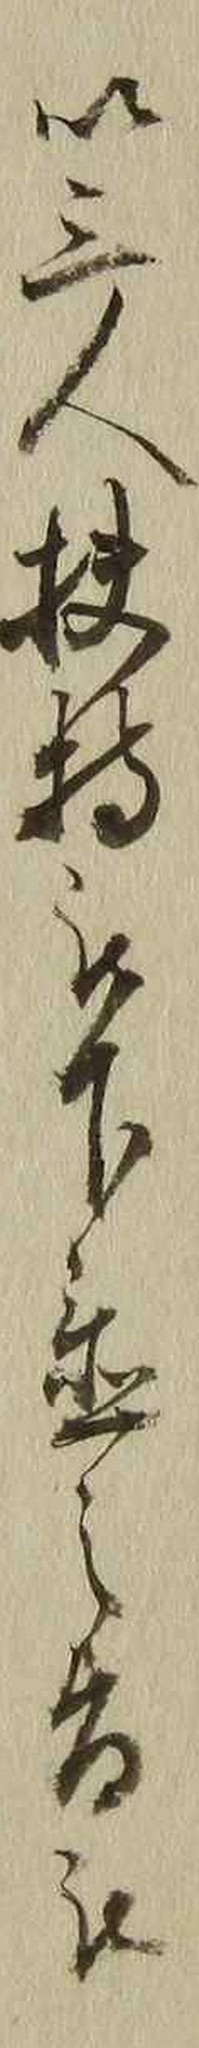以三人扶持被下置之旨被
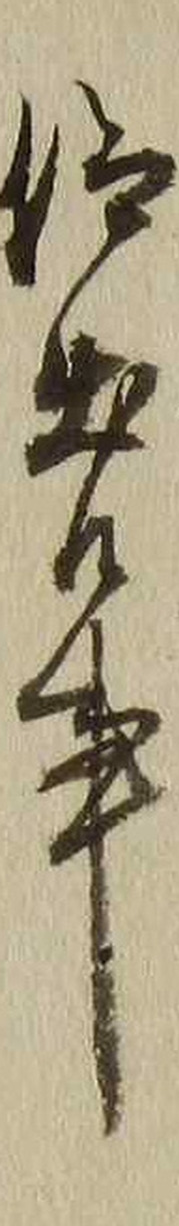仰出候事
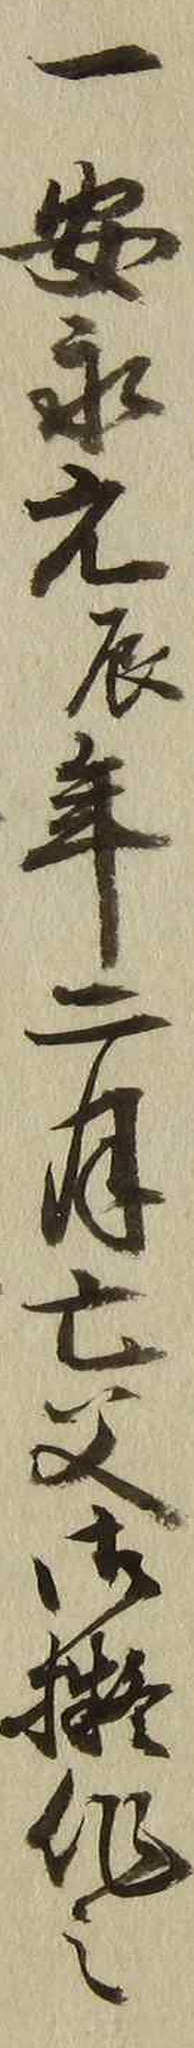一安永元辰年二月亡父御擬作之
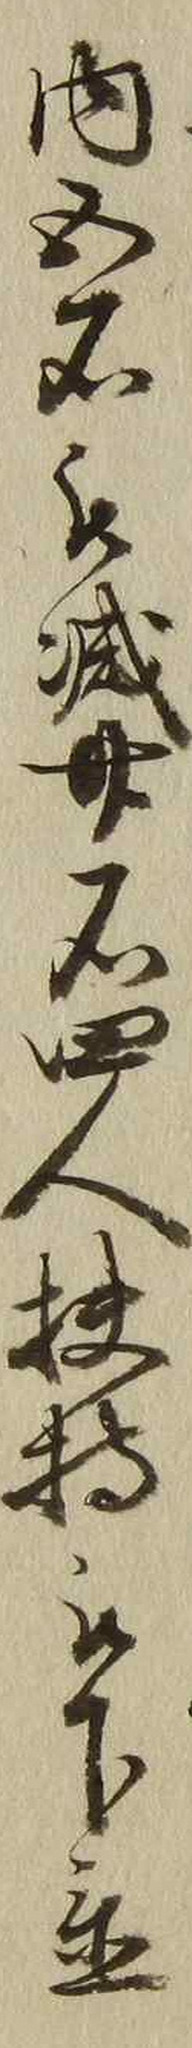内五石被減廿石四人扶持被下置
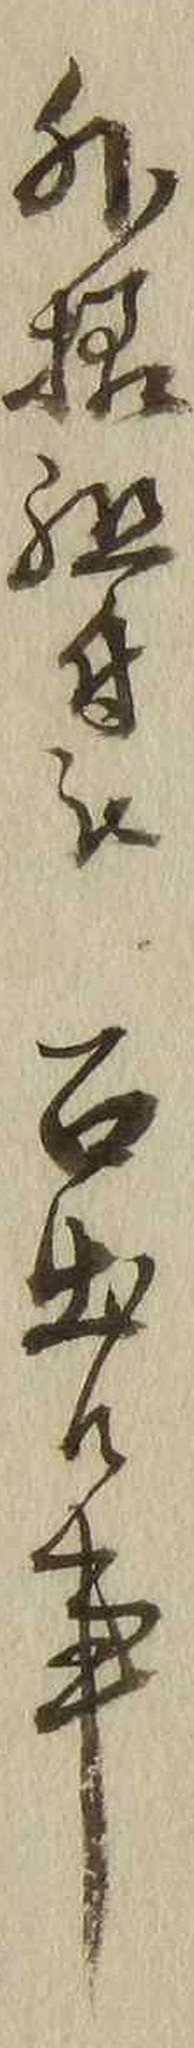外様組付被召出候事
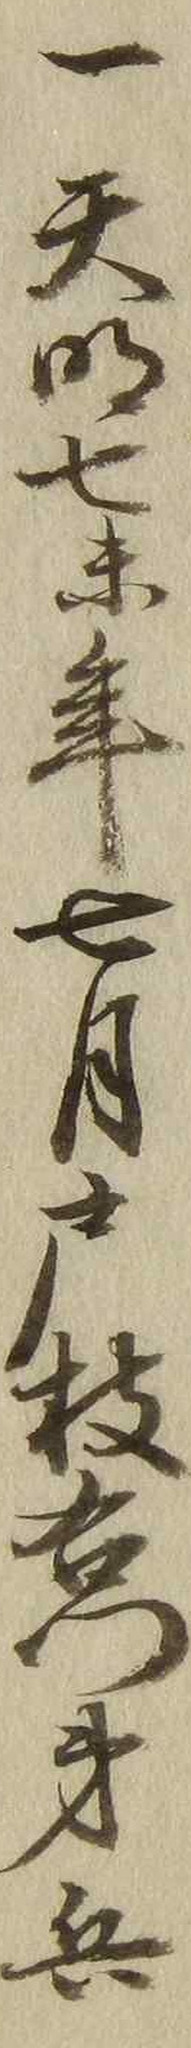一天明七未年七月戸枝右門弟兵
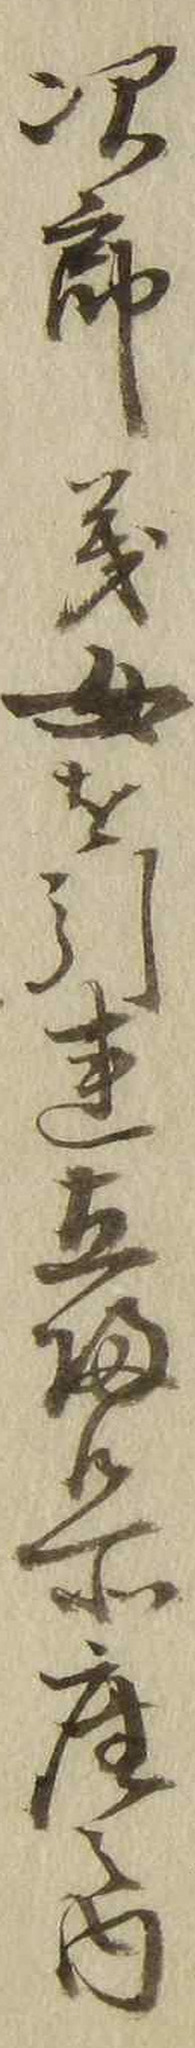次郎義女を引連立帰候所座之内

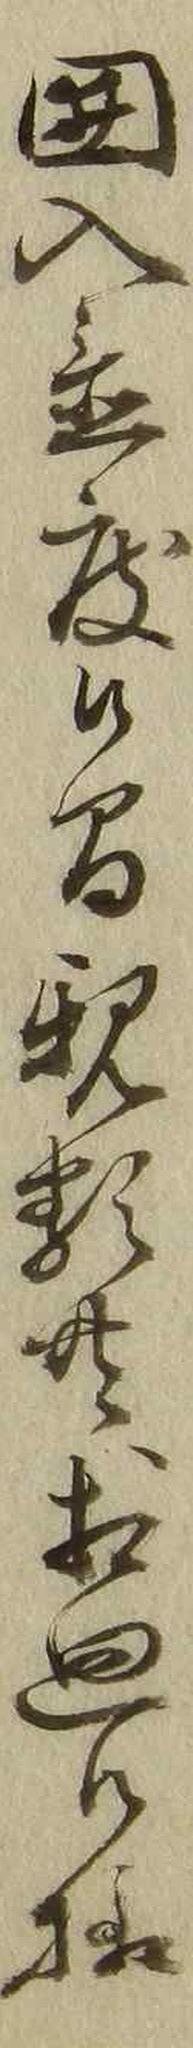囲入置度候間親類共ヘ相廻候様
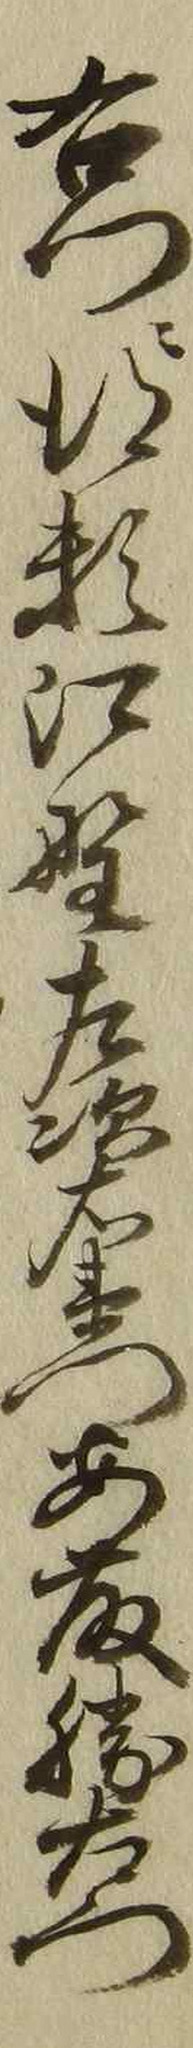右門ニ得頼江野佐治右衛門安藤勝右衛門
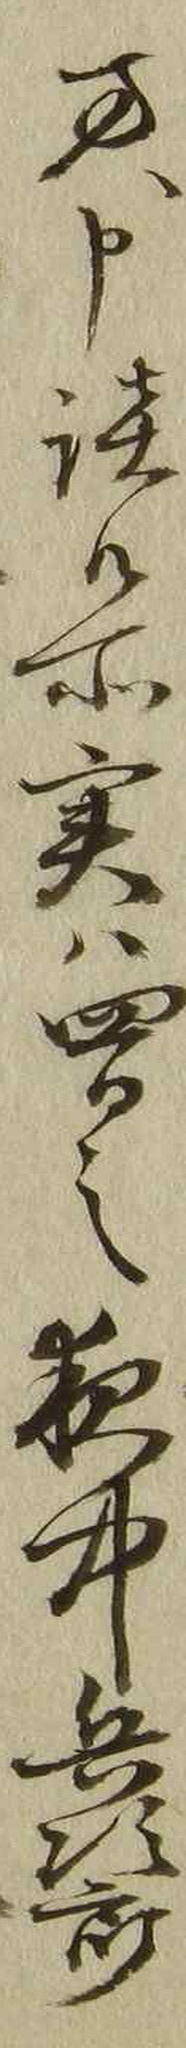方ヘ申談候所実ハ四日之夜中兵次郎
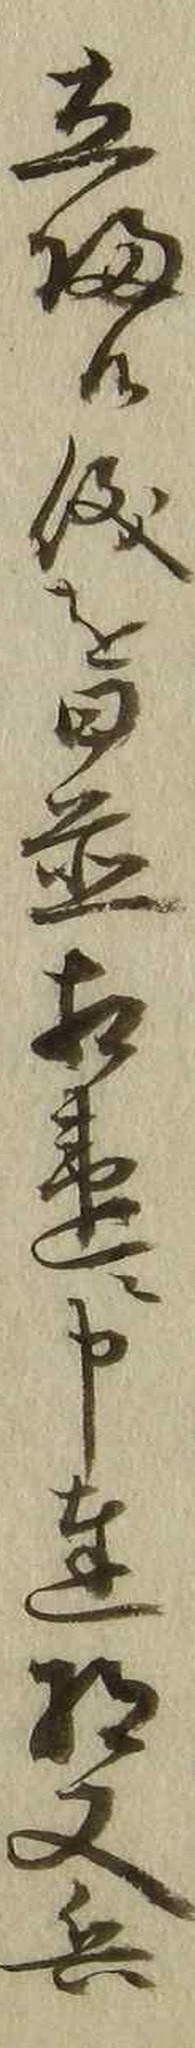立帰候儀を日並相連ニ申達将又兵
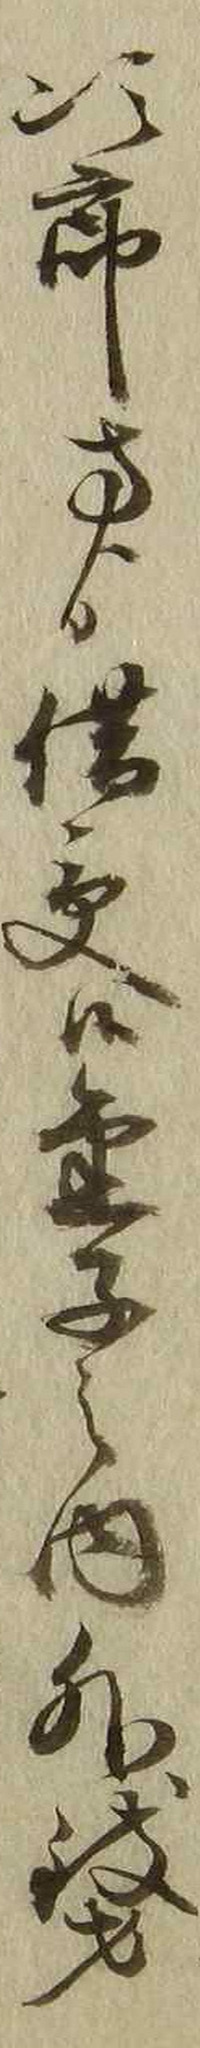次郎方ゟ借受候金子之内外ヘ致才
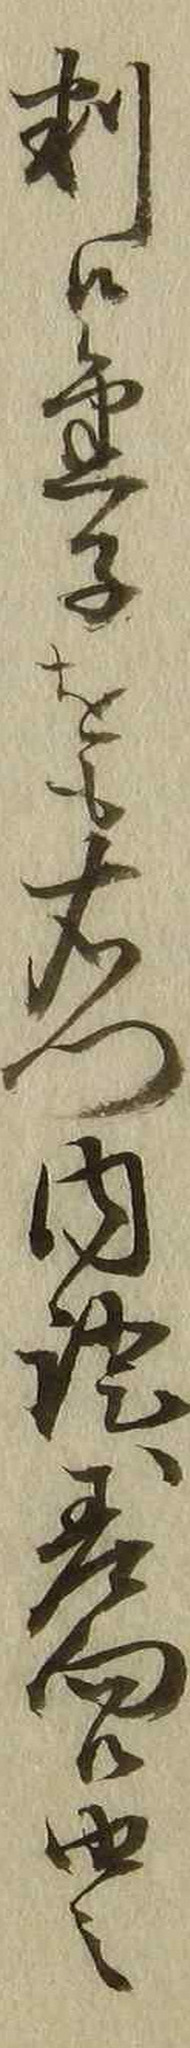判候金子をも右門内証ヘ差向候由之
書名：諸士系譜　巻之64　と之部7
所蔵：会津若松市立会津図書館
